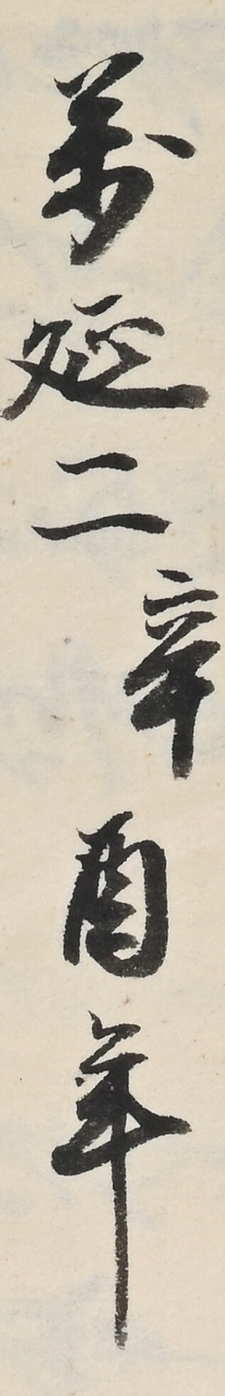㊞万延二辛酉年
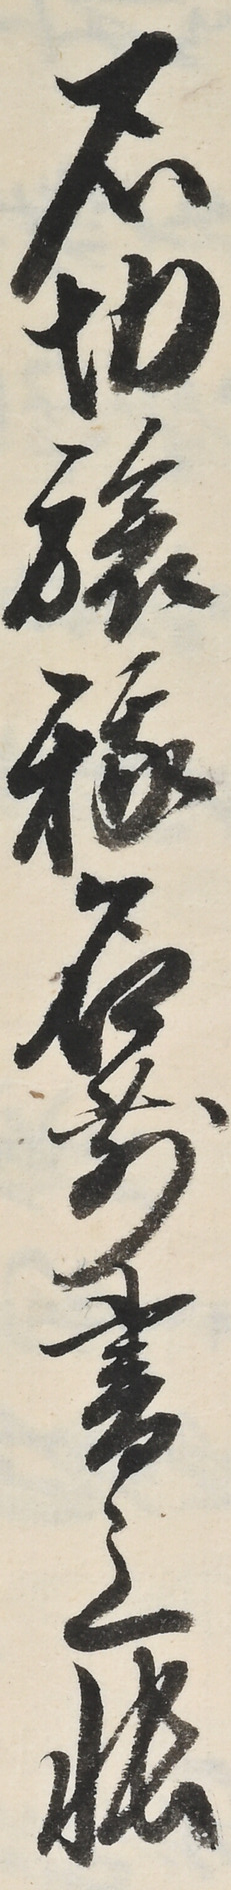石切旅稼名前書上帳

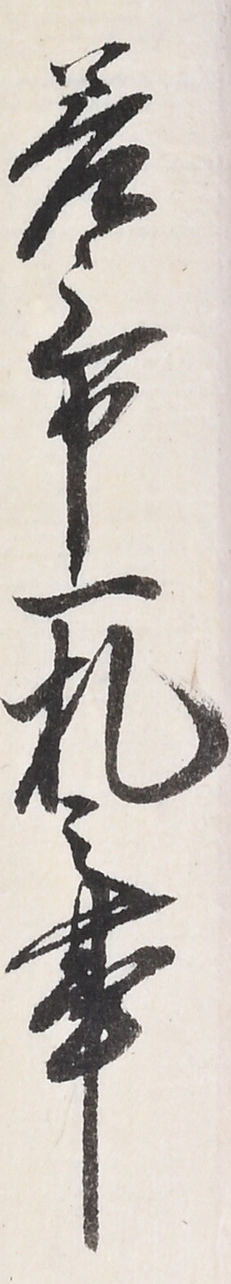差上申一札之事
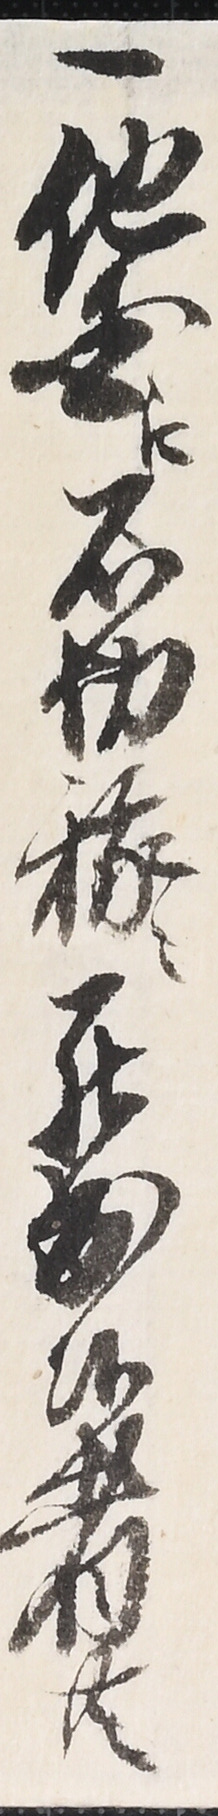一他国え石切稼ニ罷出候者共
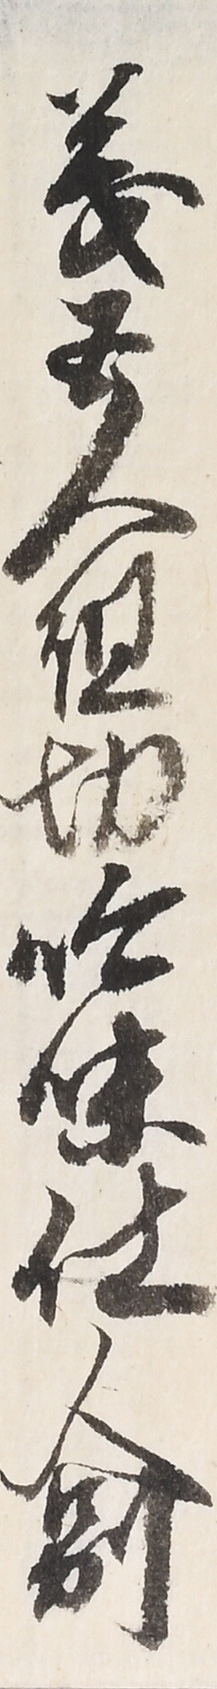義五人組切吟味仕人別
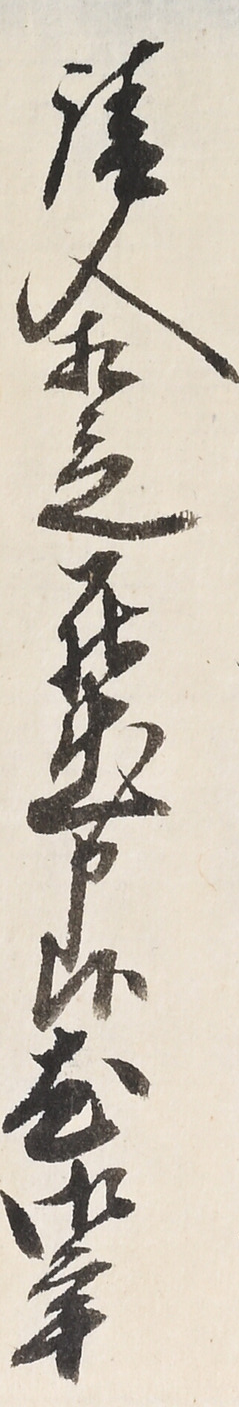請人相立罷出申候尤御年
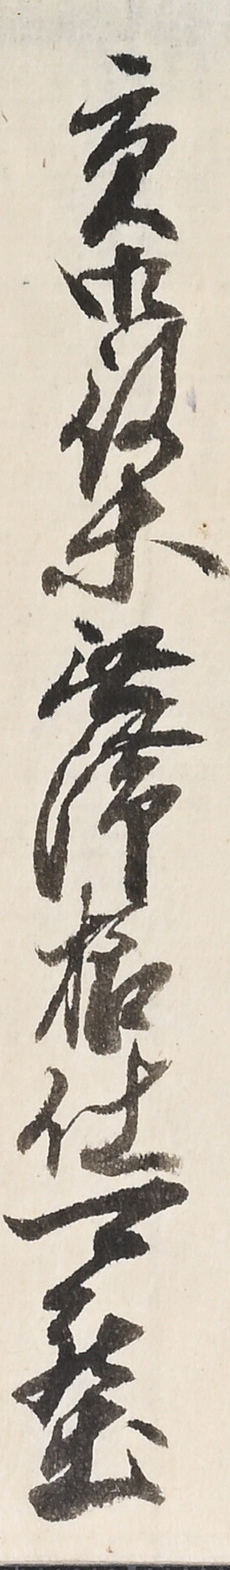貢御役等無滞様仕可罷出
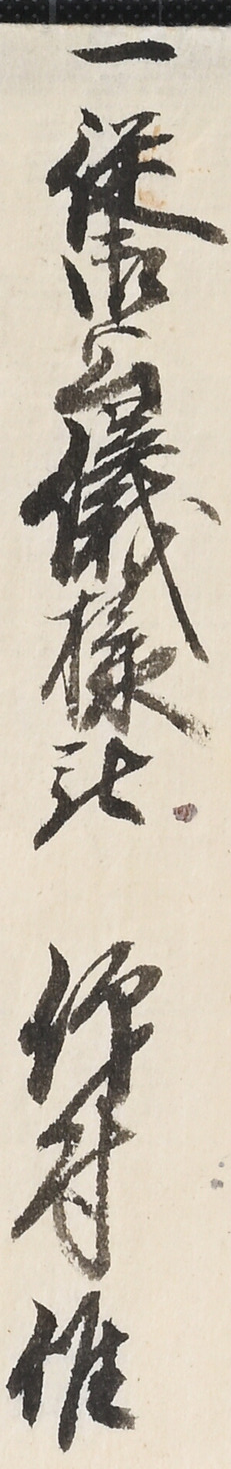一従御公儀様被仰付候
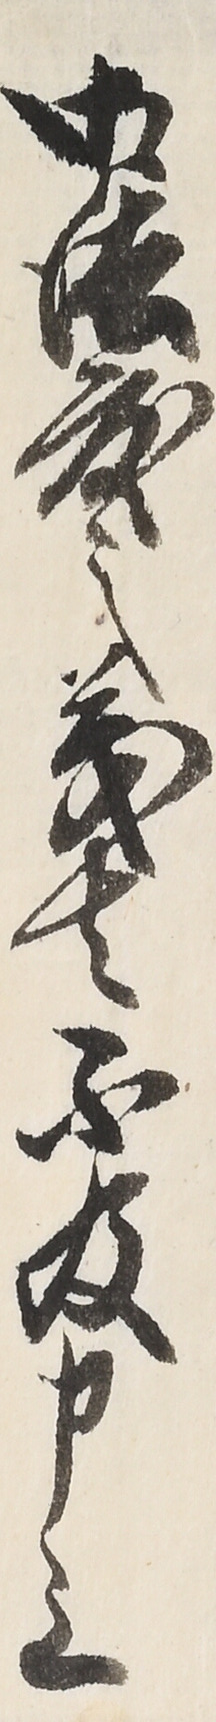御法度之儀者不及申上
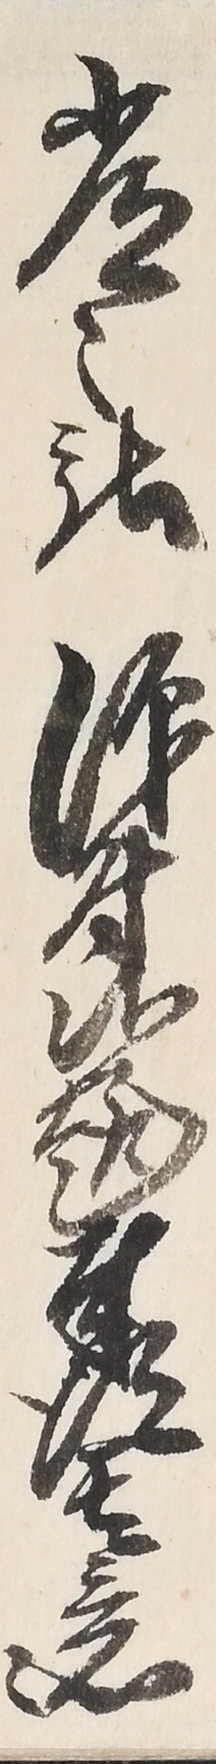常々被仰付候趣奉得其意
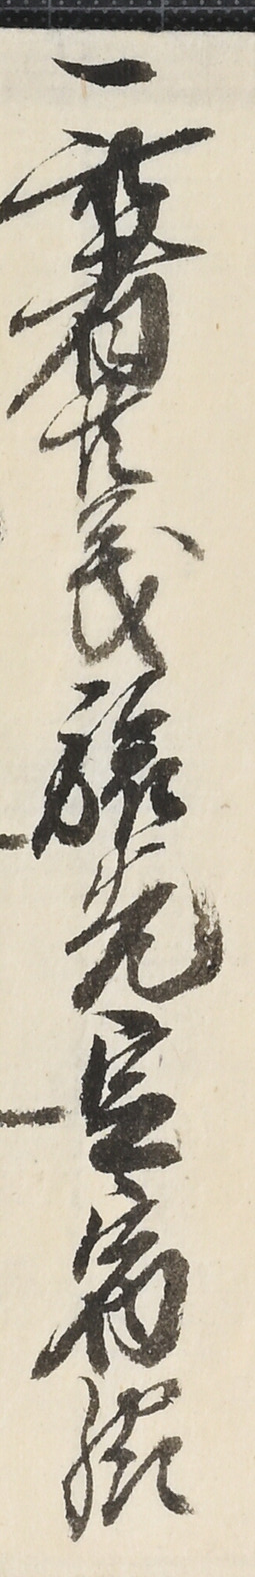一此者共義旅先定宿脇
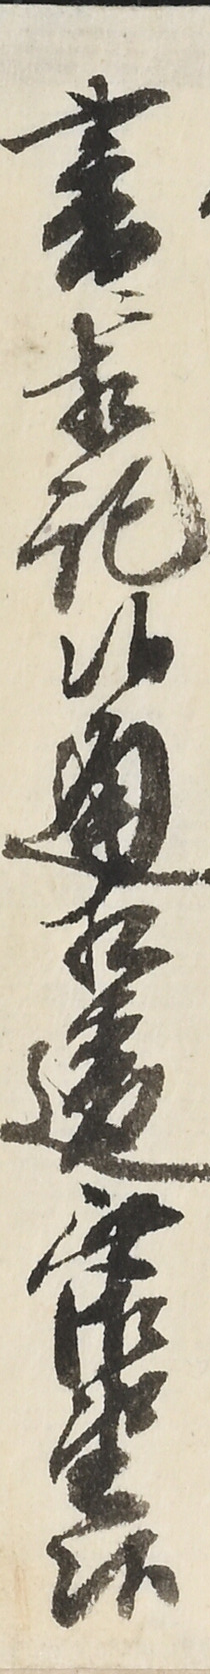書ニ相記候通相違無御座候
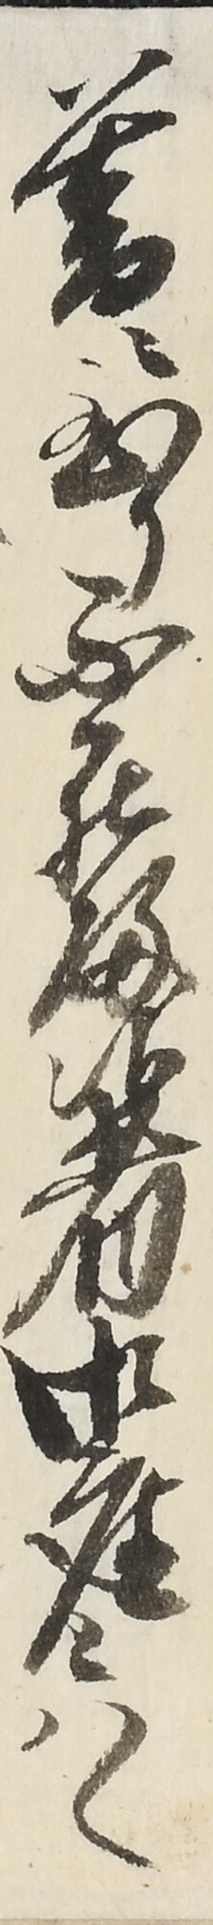暮ニ至り不罷帰候者御座候ハヽ
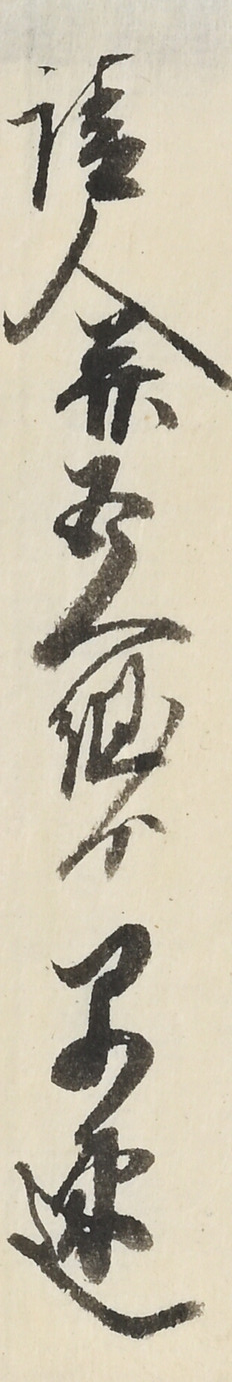請人幷五人組より早速
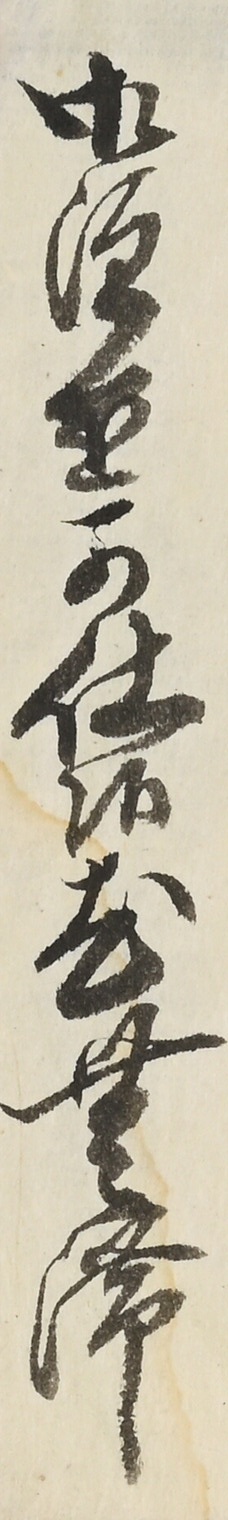御注進可仕候尤無滞

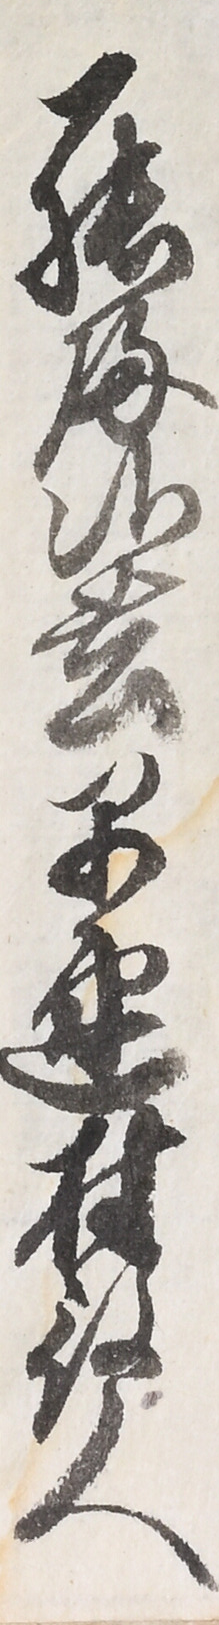罷帰候共早速村役人
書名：萬延二辛酉年正月石切旅稼名前書上帳
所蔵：伊那市立高遠町図書館・合同会社AMANE
